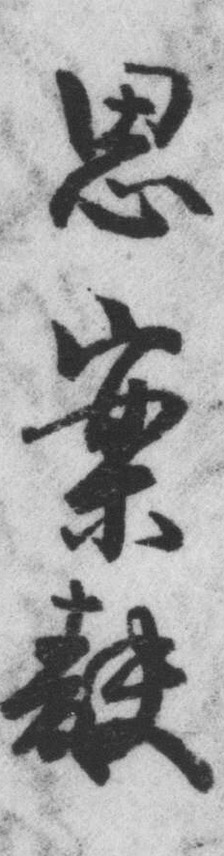思案麩
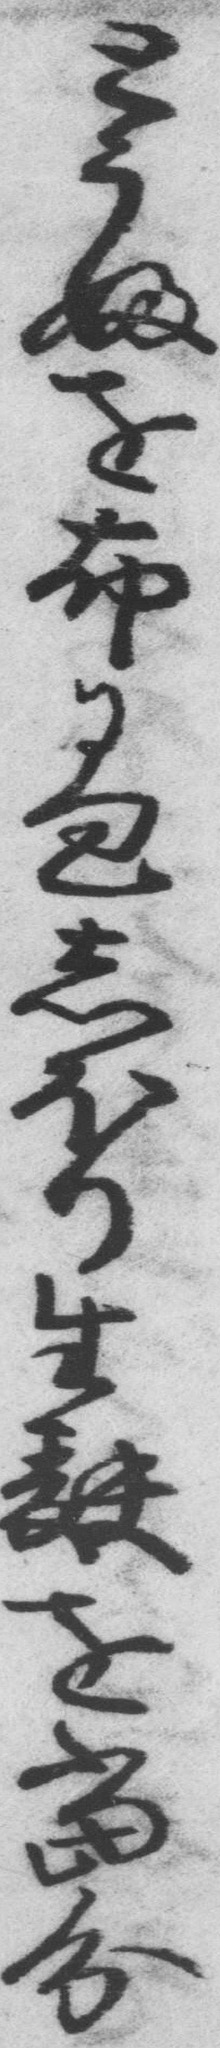とうふを布に包しほり生麩を当分
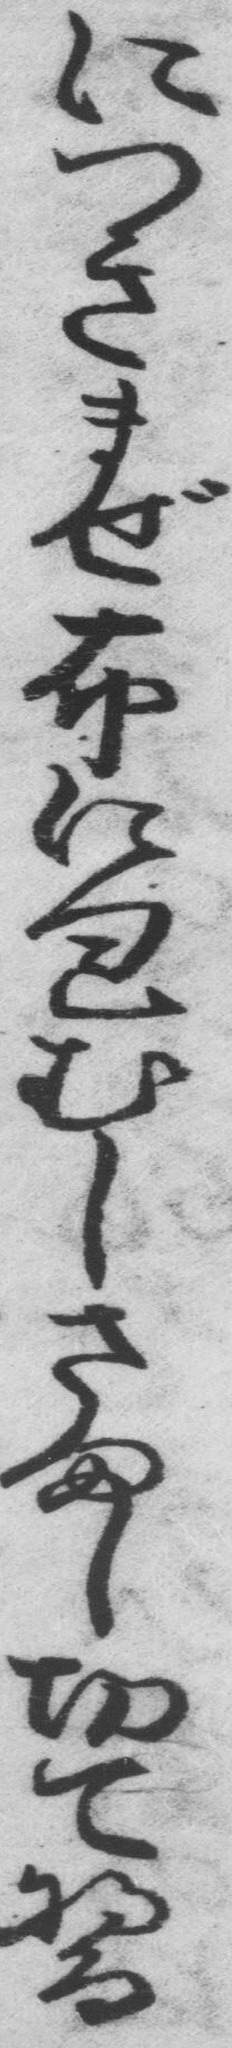につきまぜ布に包むしさまし切て醤
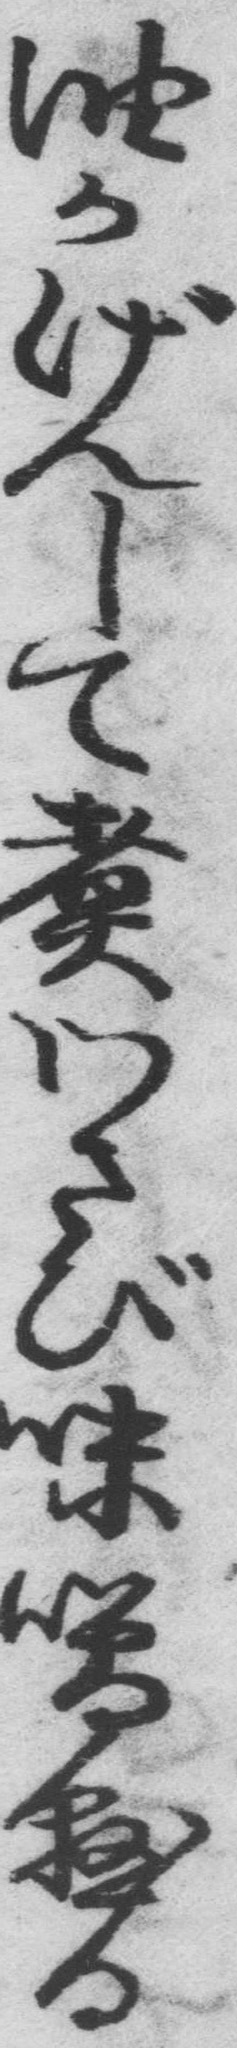油かげんして煮わさび味噌懸る
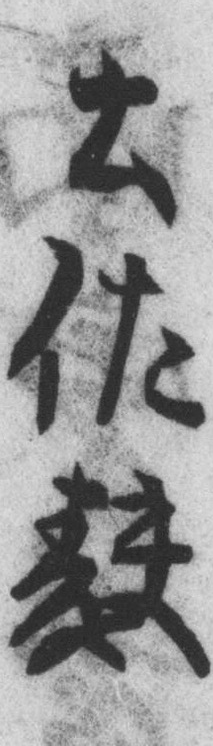土佐麩
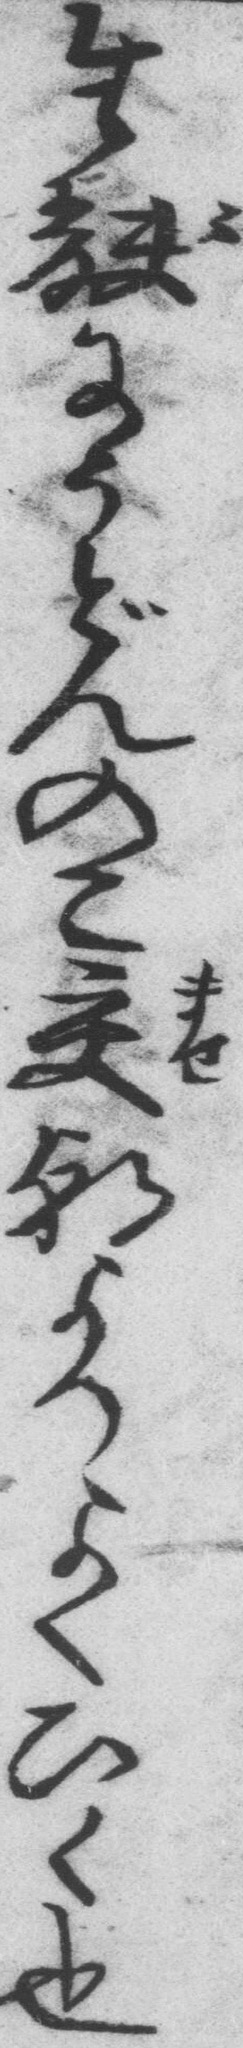生麩にうどんのこ交朝よりよくひく也
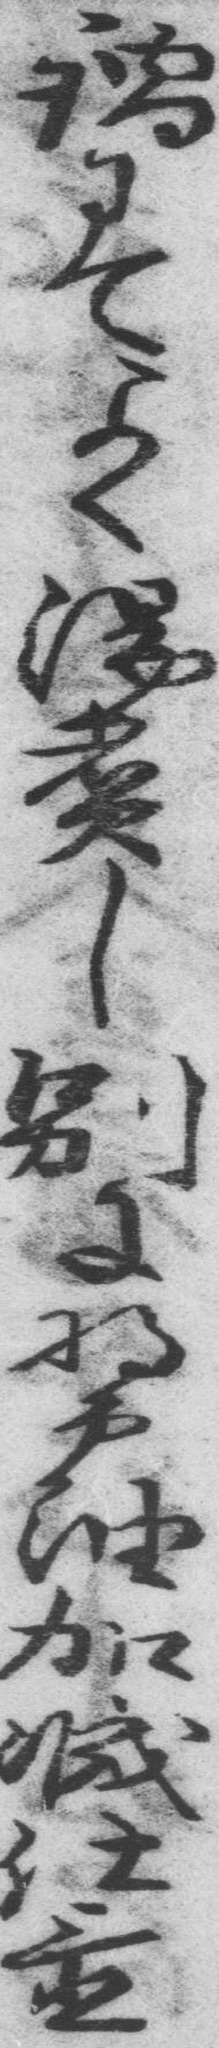鍋にてよく湯煮し別に醤油加減仕置
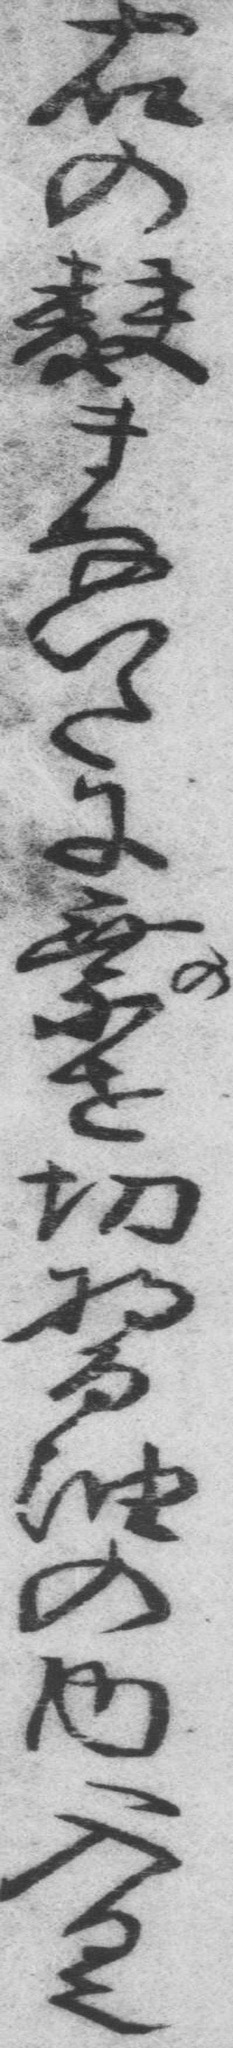右の麩まないたに乗せ切醤油の内へ入る也
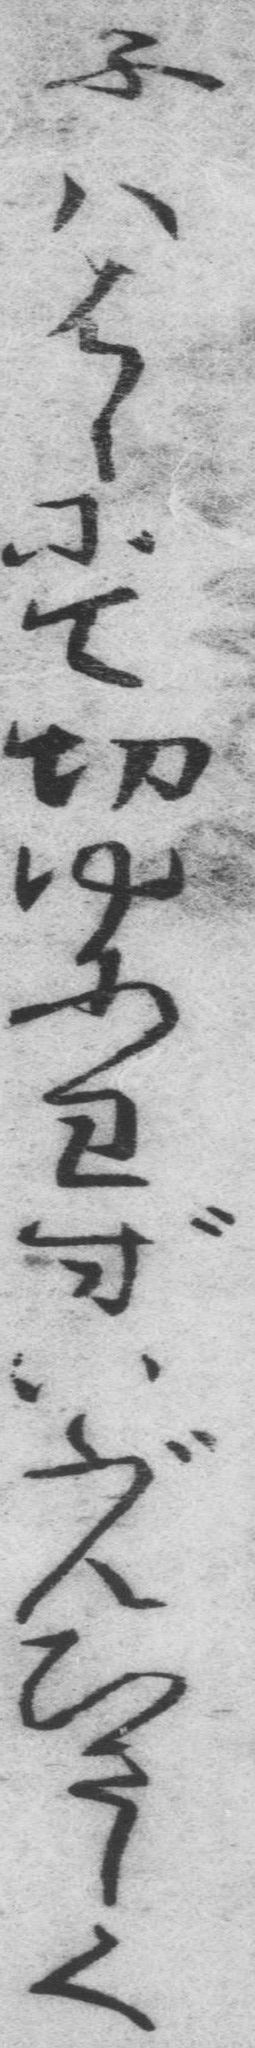ふははしにて切ゆにわにわずいぶんひさしく
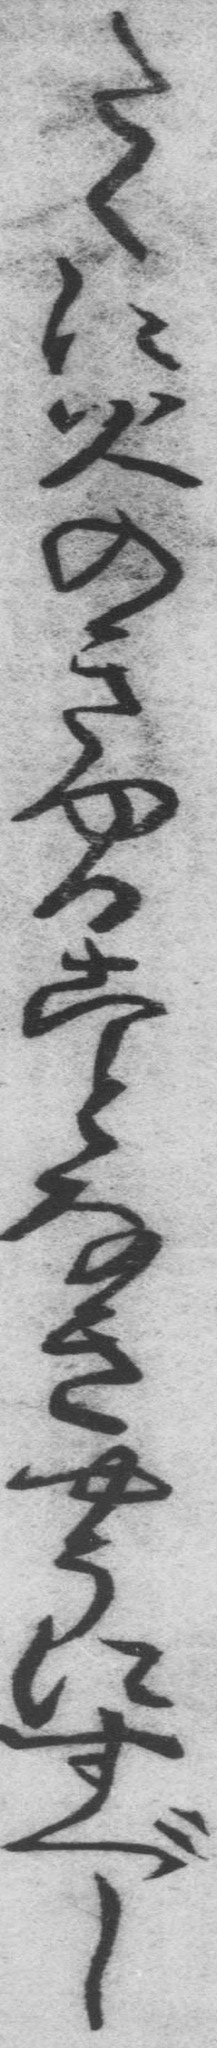たくに火のきゆることなきやうにすべし
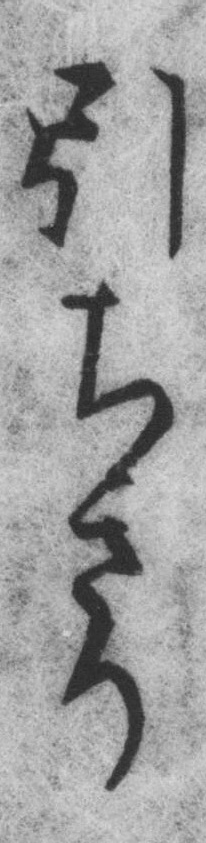引ちきり

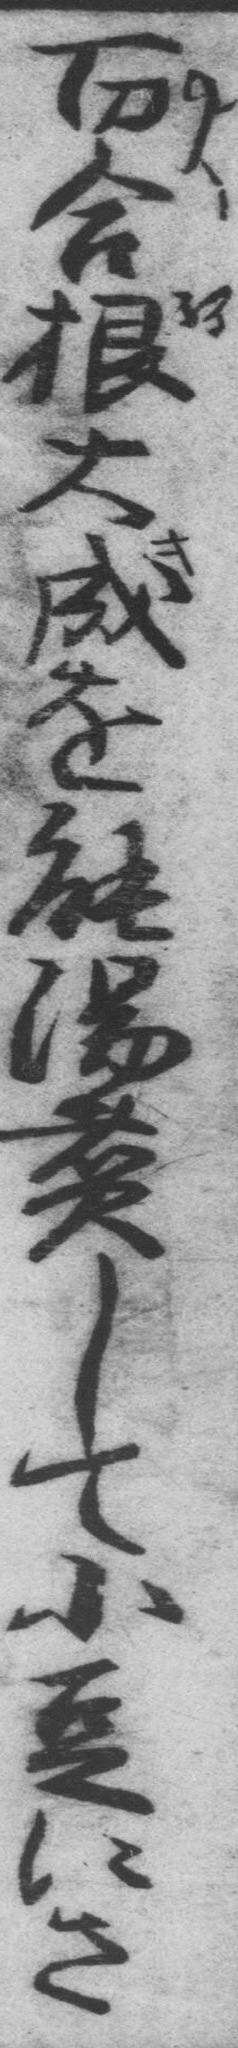百合根大き成を能湯煮して小豆にさ
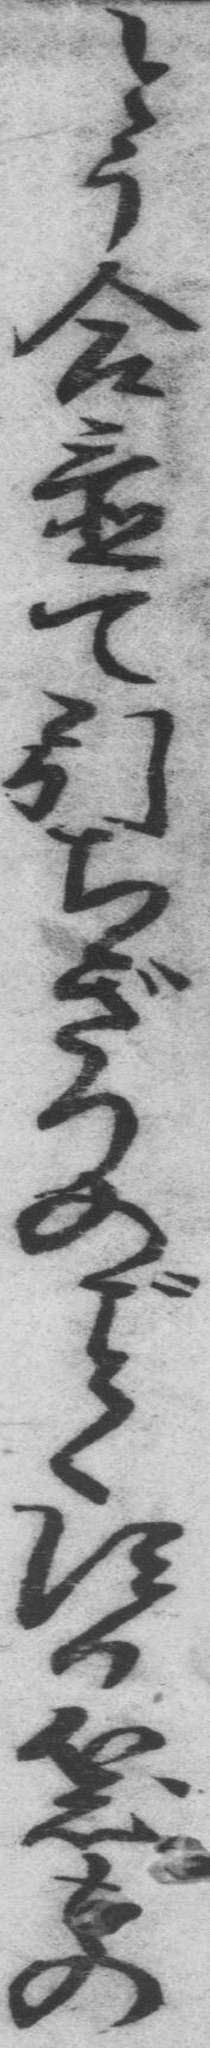とう合置て引ちぎりのごとくする器もの
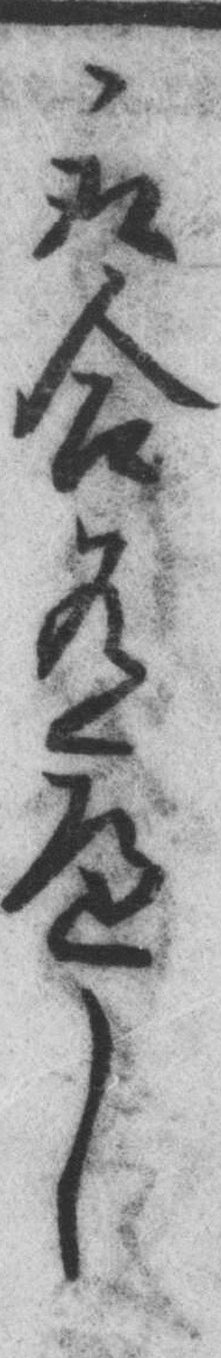取合有へし
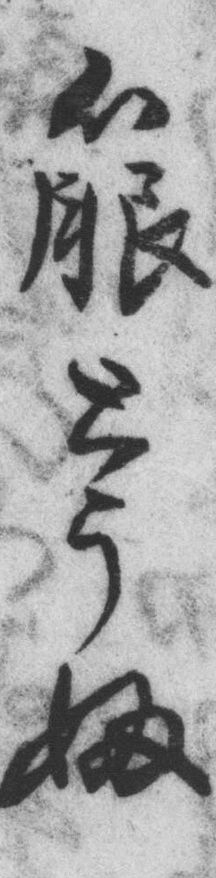箙とうふ
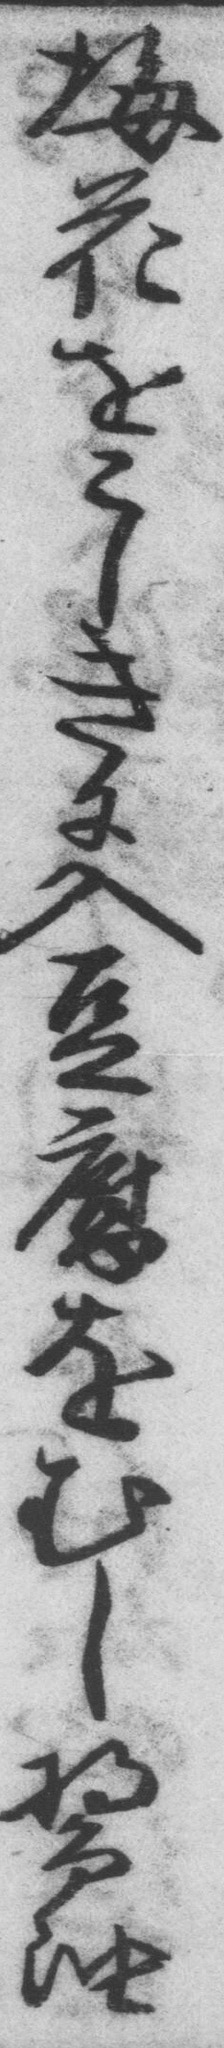梅花をこしきに入豆腐をむし醤油
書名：料理山海郷
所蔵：大阪府立大学学術情報センター 国文学研究資料館
